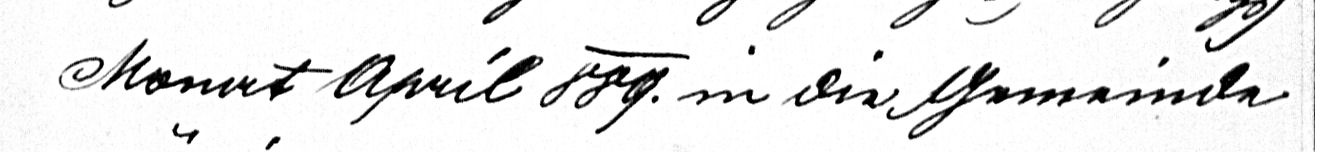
Monat April 889. in die Gemeinde
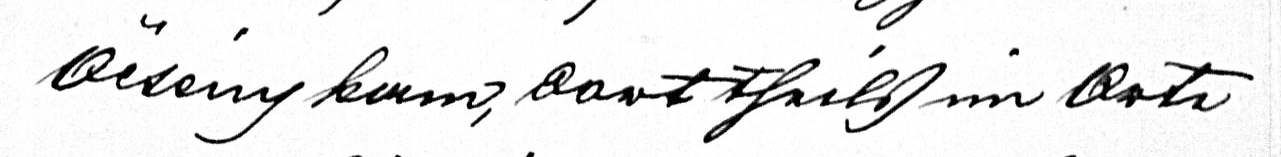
Öcsény kam, dort theils im Orte
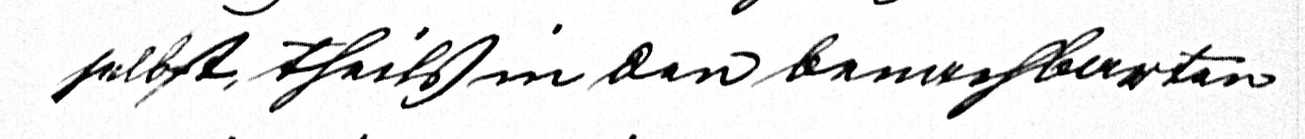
selbst, theils in den benachbarten
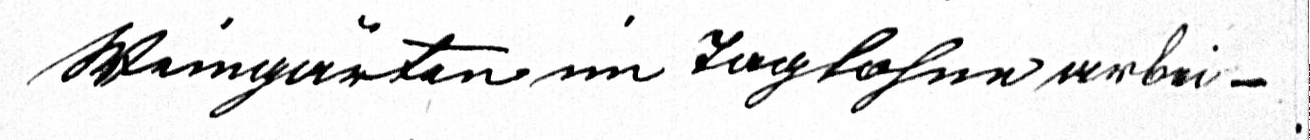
Weingärten im Taglohne arbei¬
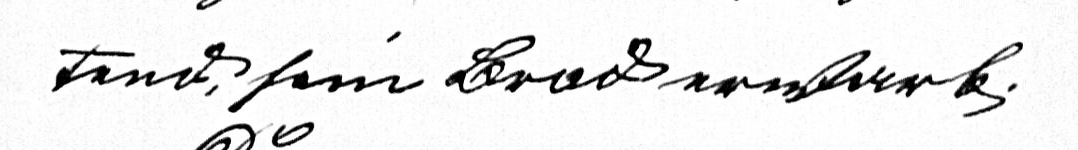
tend, sein Brod erwarb.
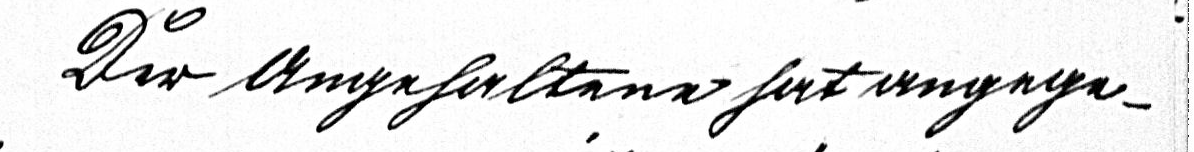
Der Angehaltene hat angege¬
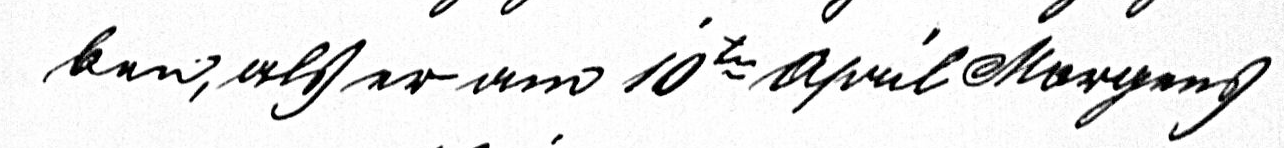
ben, als er am 10ten April Morgens
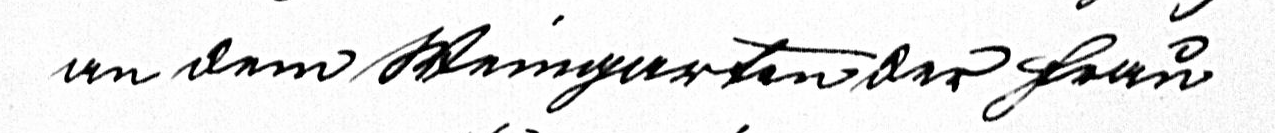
an dem Weingarten der Frau
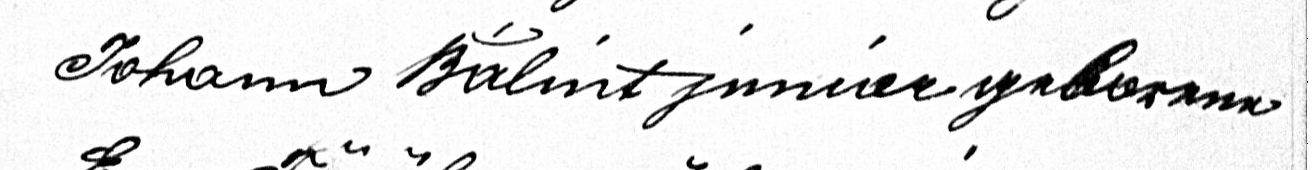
Johann Bálint junior geborene
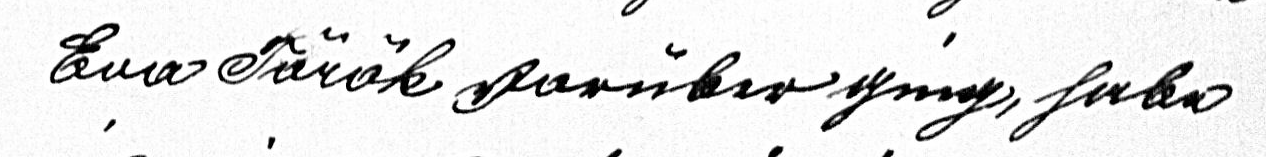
Eva Török vorüber ging, habe
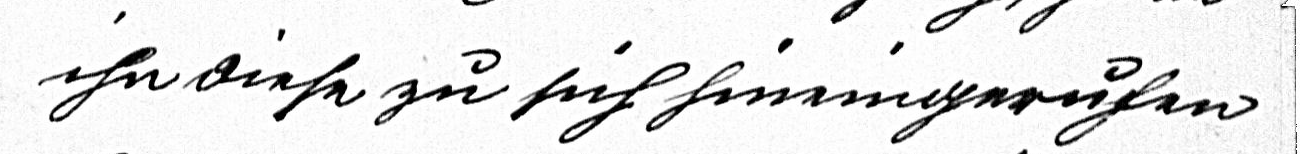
ihn diese zu sich hineingerufen
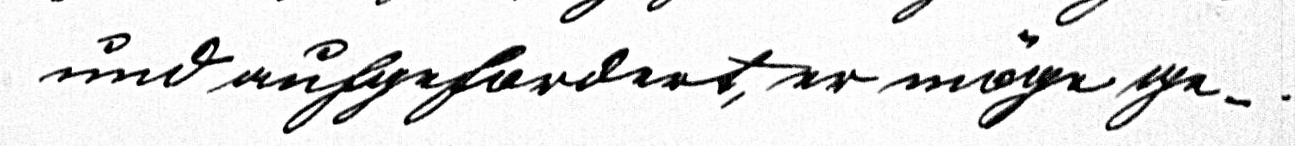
und aufgefordert, er möge ge¬
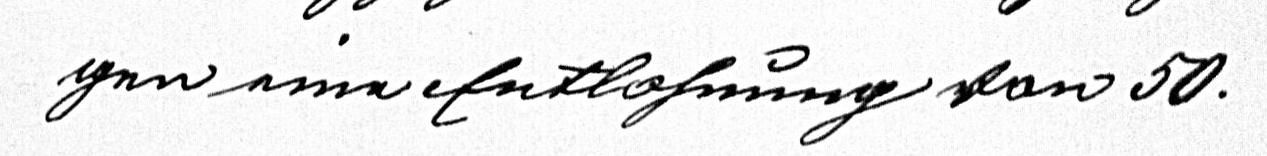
gen eine Entlohnung von 50.
